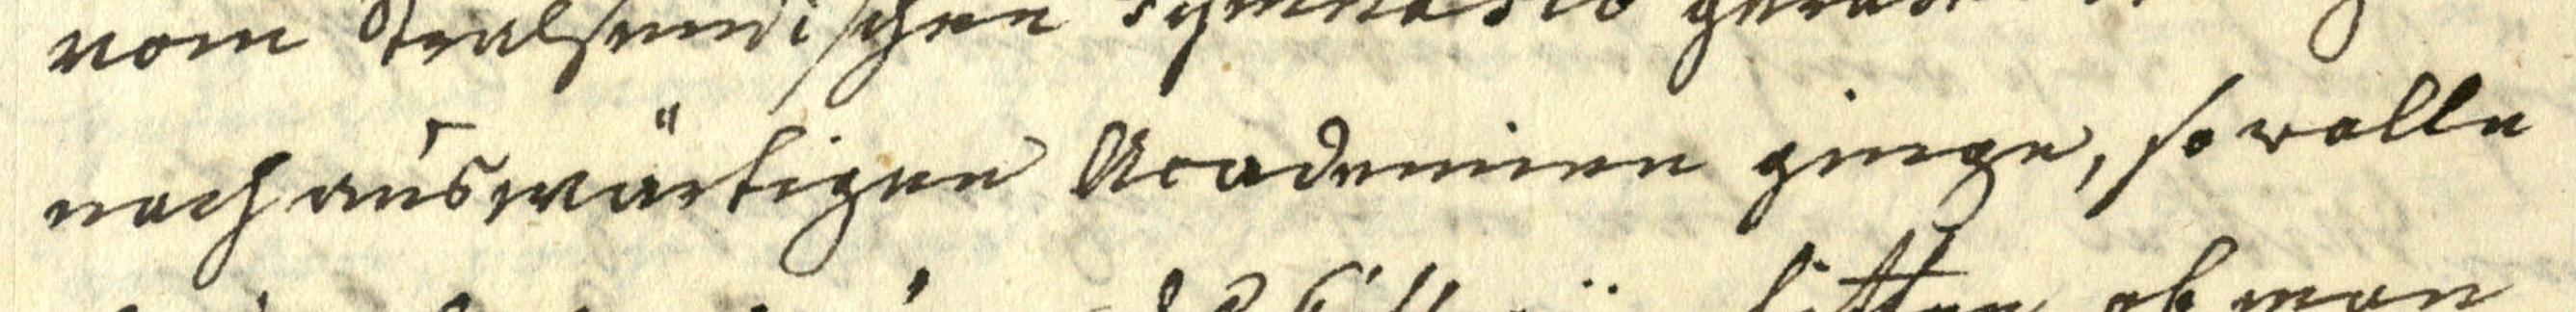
nach auswärtigen Academien ginge, so wolle
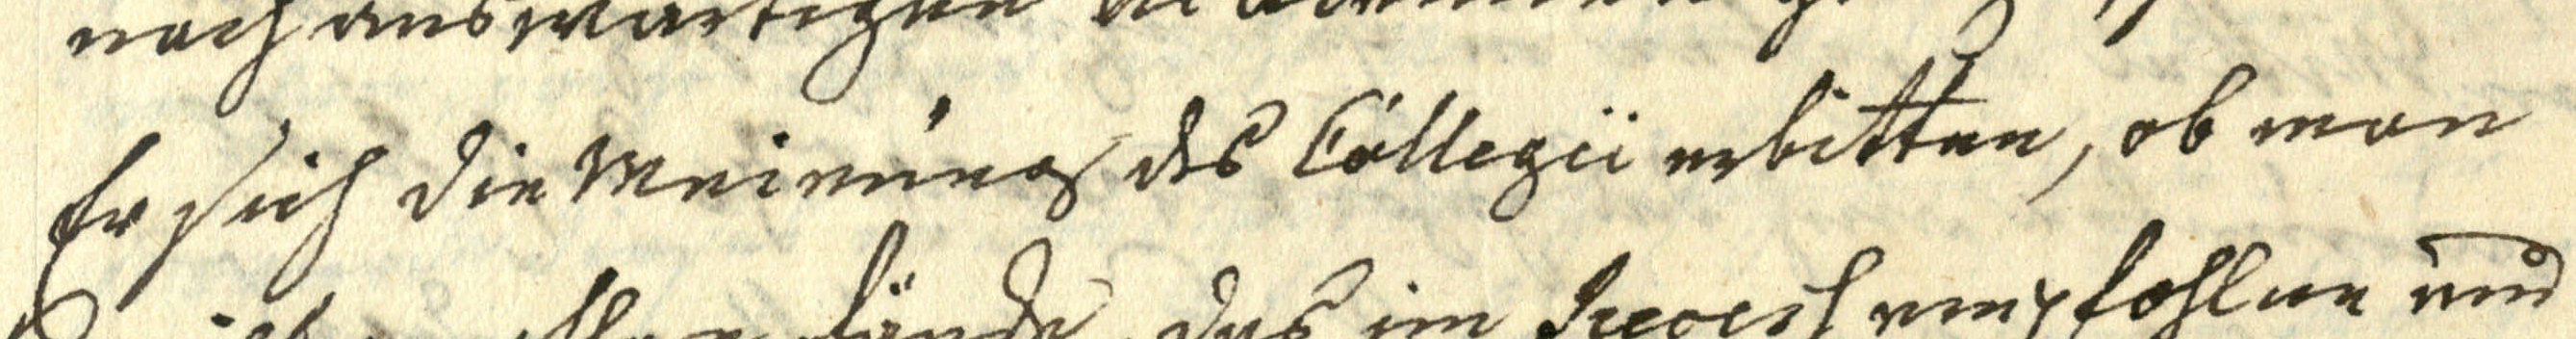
Er sich die Meinung des Collegii erbitten, ob man
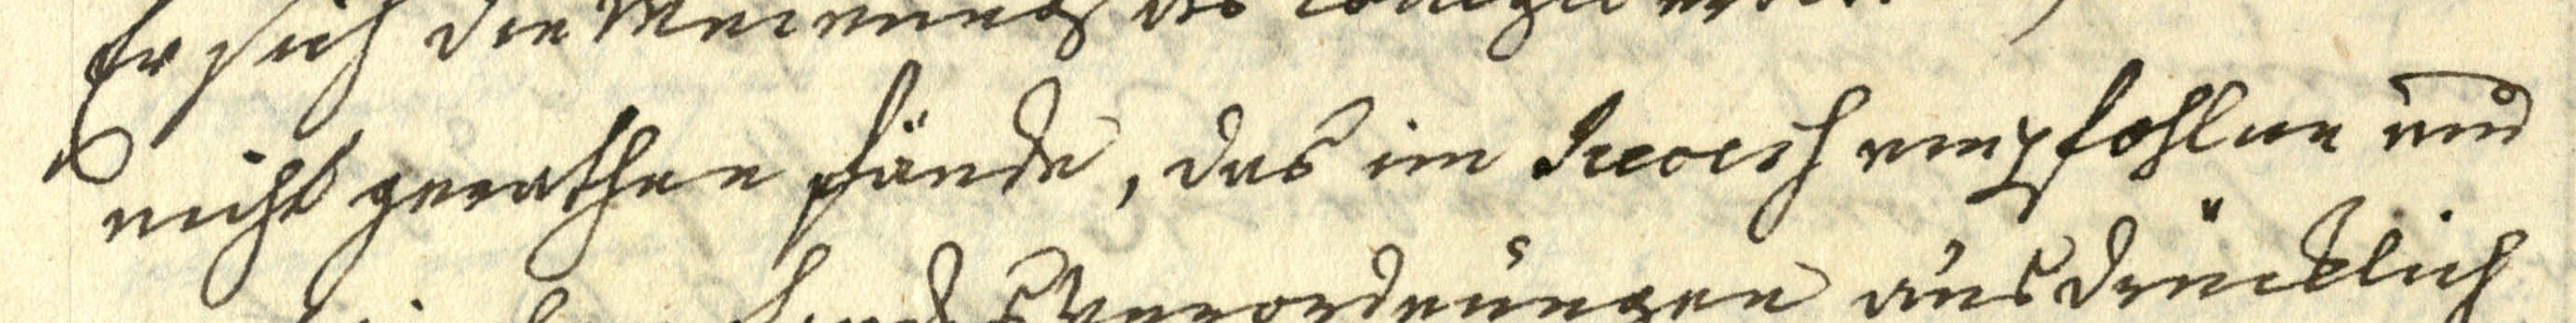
nicht gerathen fände, das im Recess empfohlen und
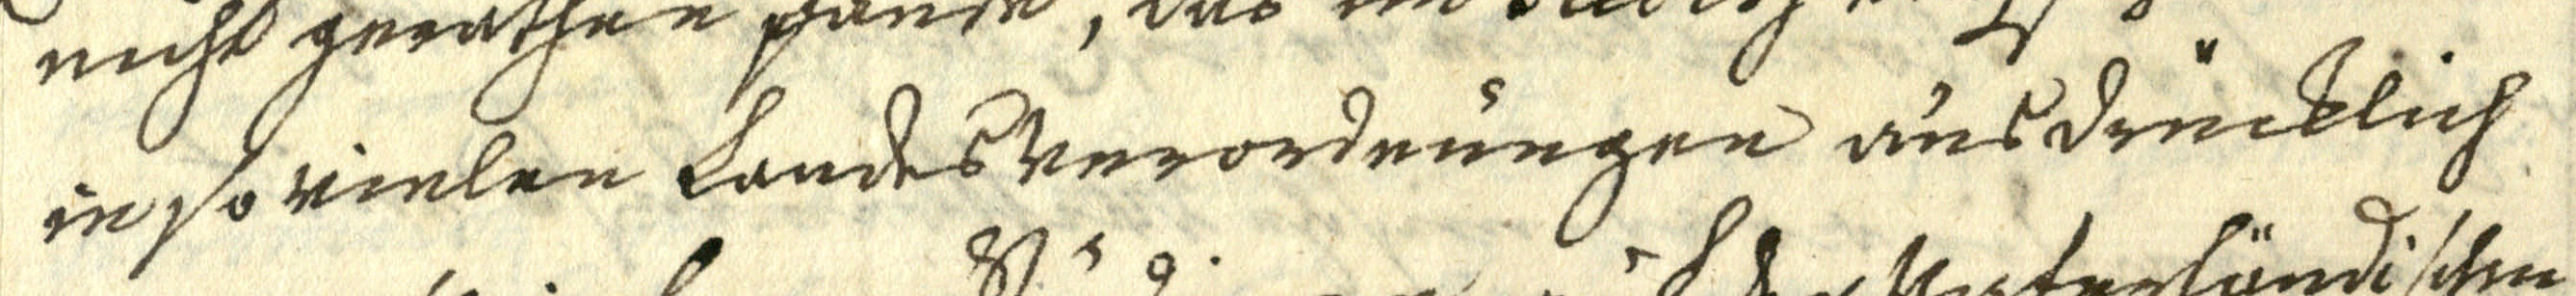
in so vielen Landes Verordnungen ausdrücklich
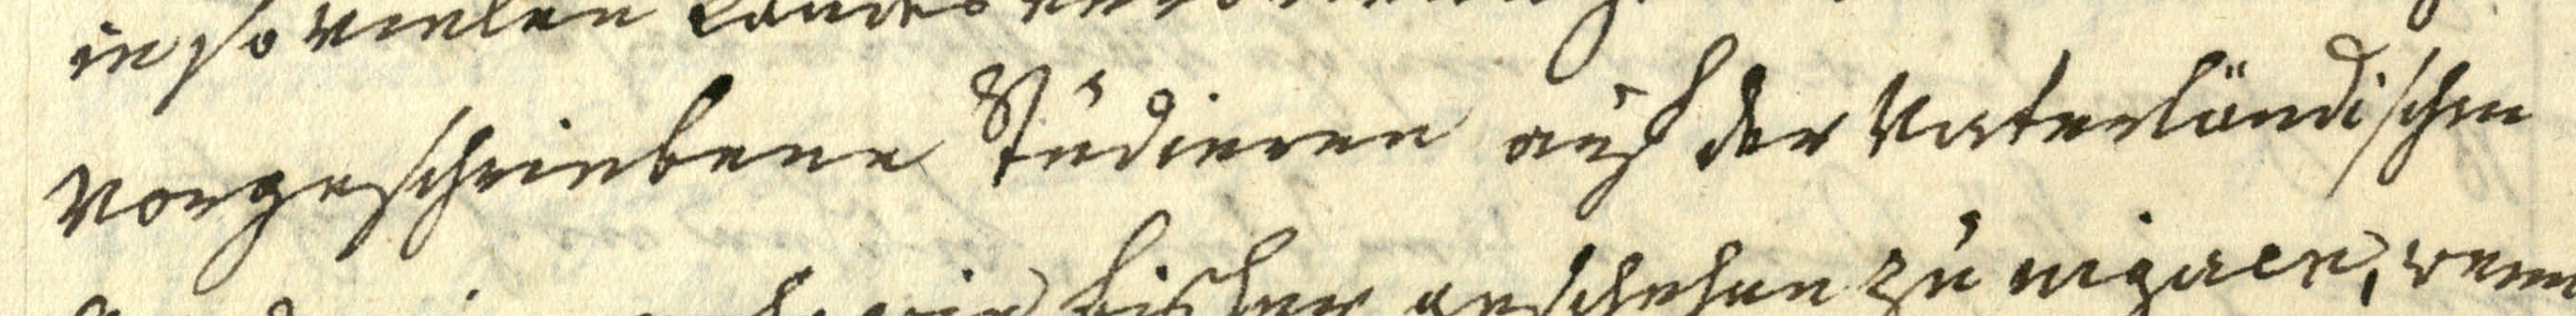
vorgeschriebene Studieren auf der Vaterländischen
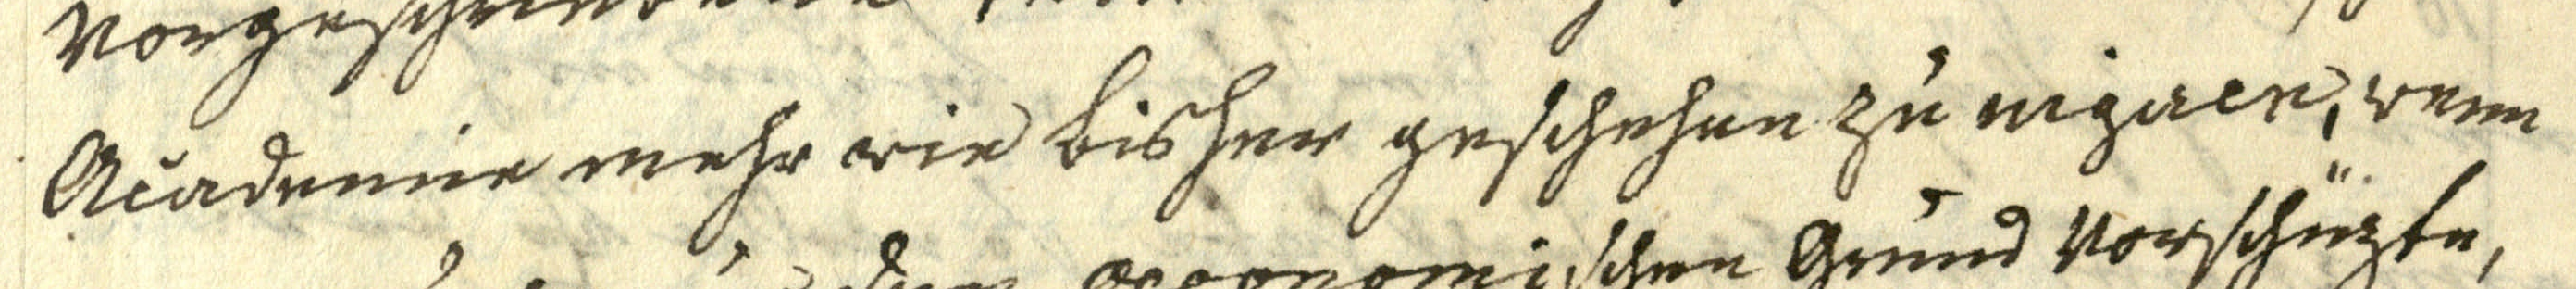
Academie mehr wie bisher geschehen zu reagiren, wenn
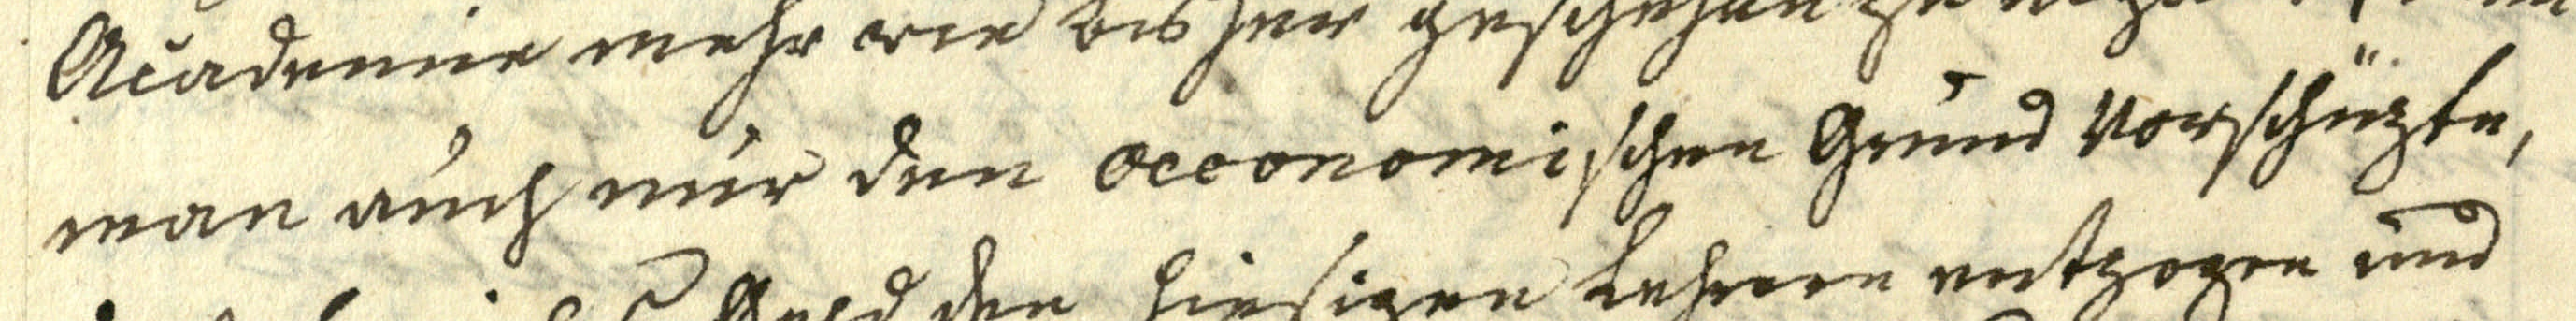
man auch nur den oeconomischen Grund vorschüzte,
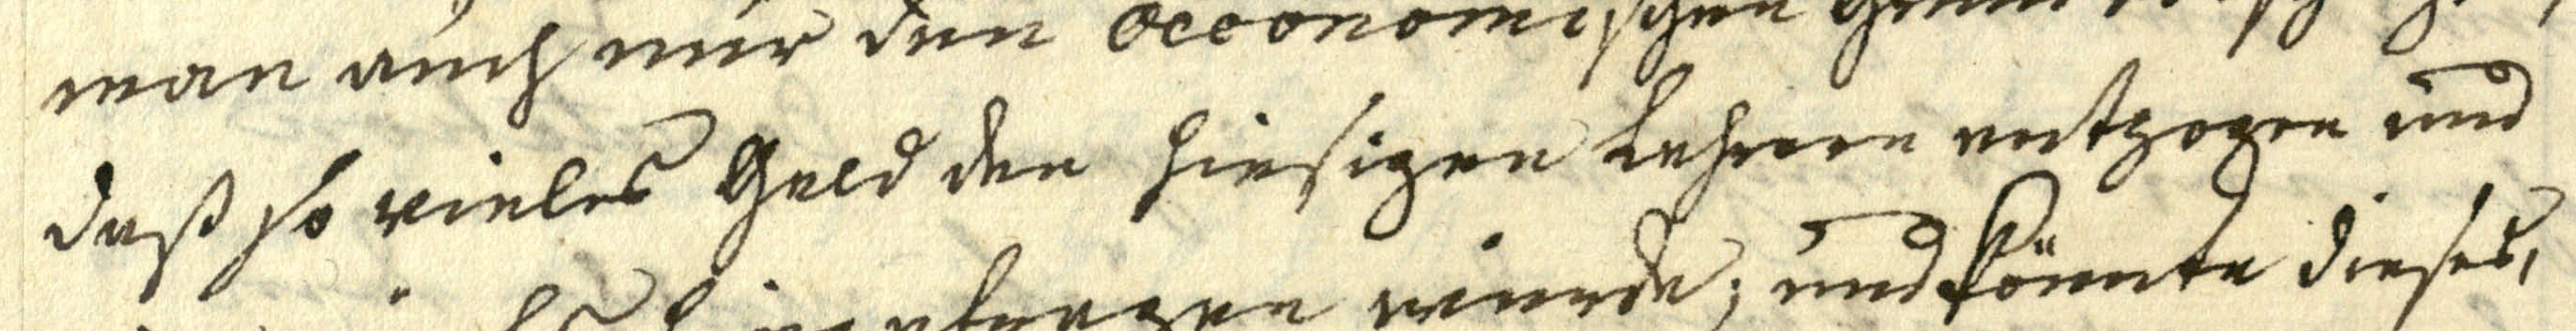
daß so vieles Geld den hiesigen Lehrern entzogen und
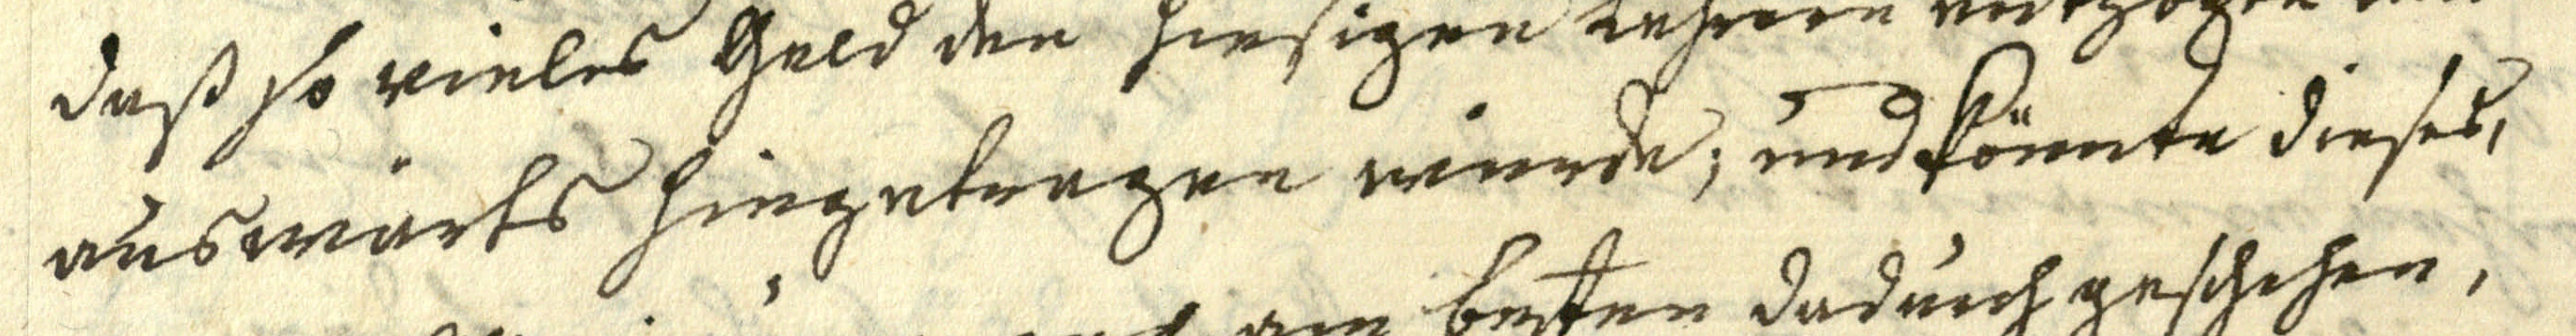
auswärts hingetragen würde, und könnte dieses,
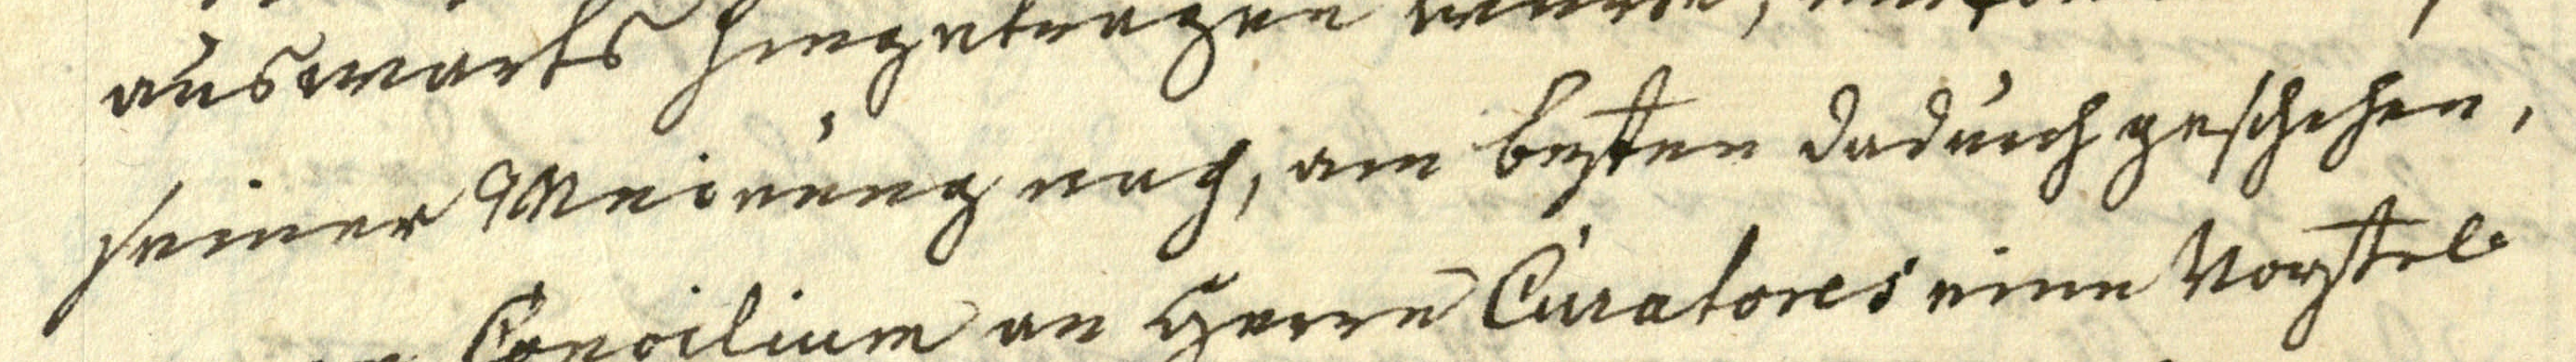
seiner Meinung nach, an besten dadurch geschehen,
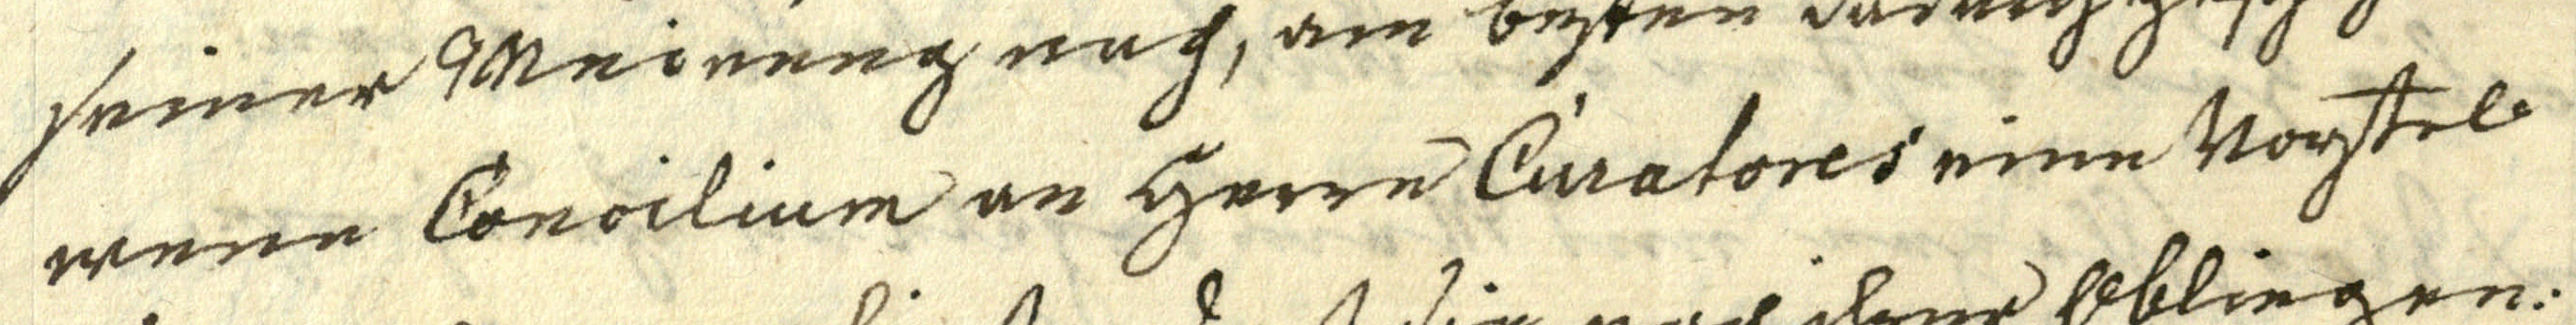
wenn Concilium an Herrn Curatores eine Vorstel¬
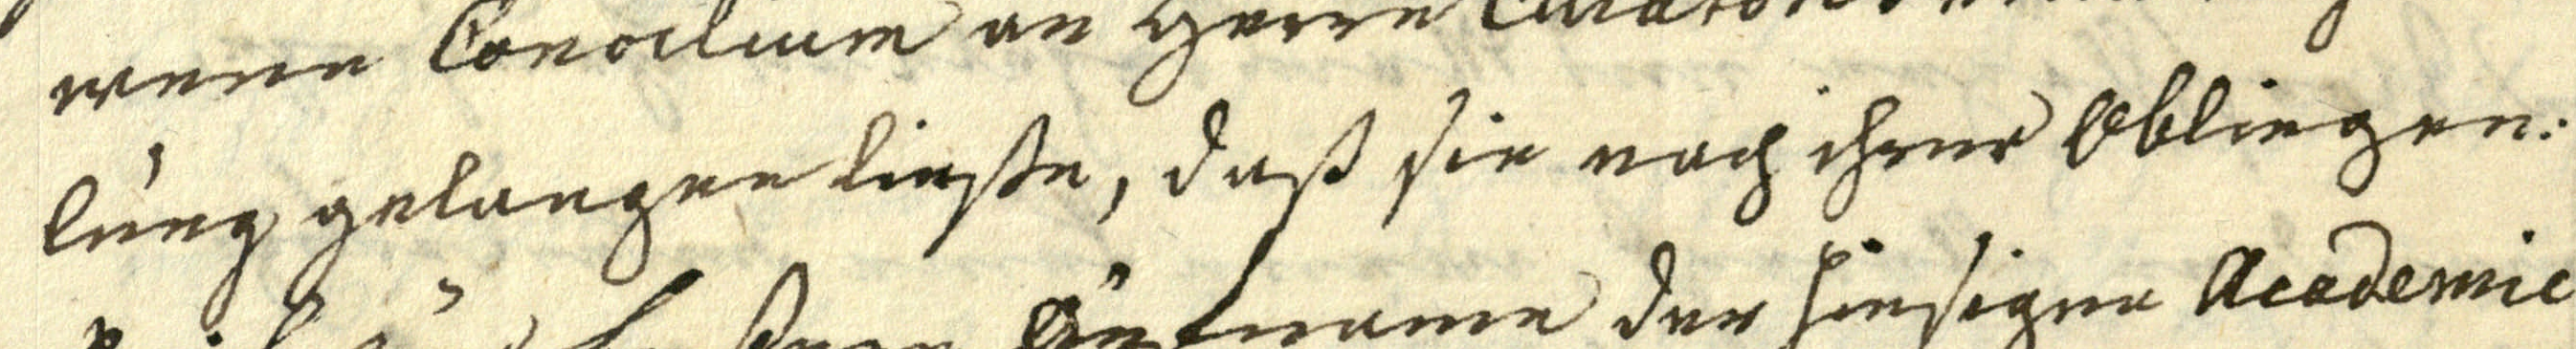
lung gelangen ließe, daß sie nach ihrer Obliegen¬
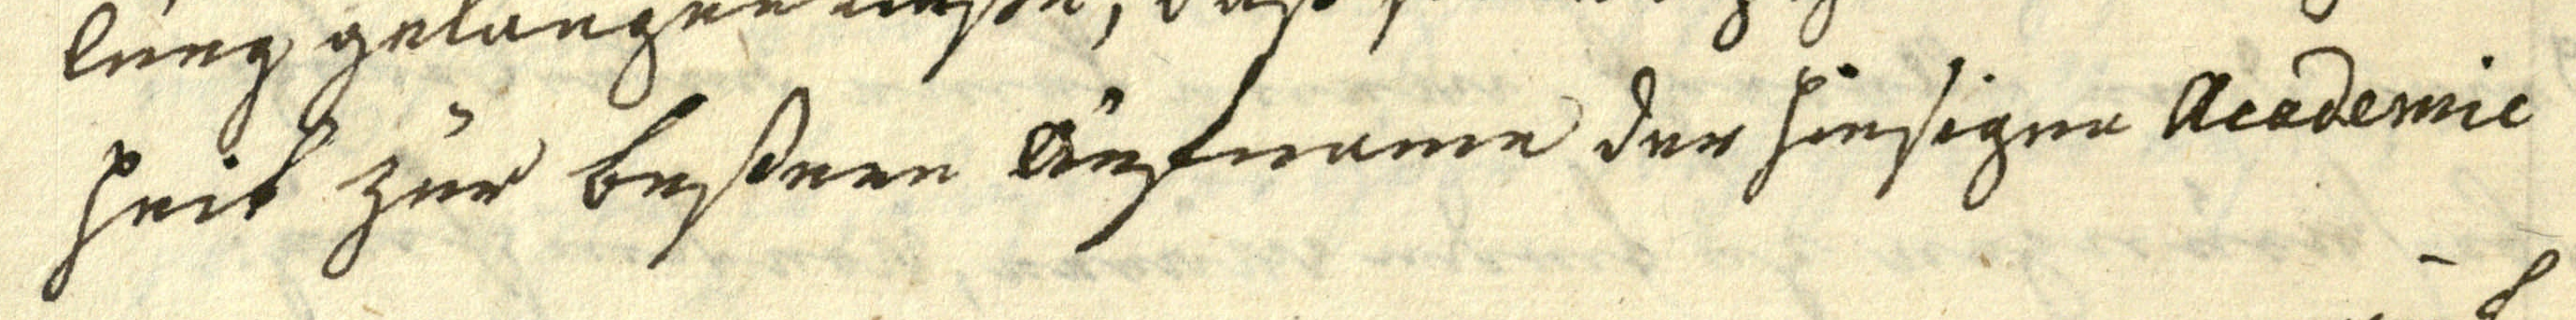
heit zur beßern Aufname der hiesigen Academie
